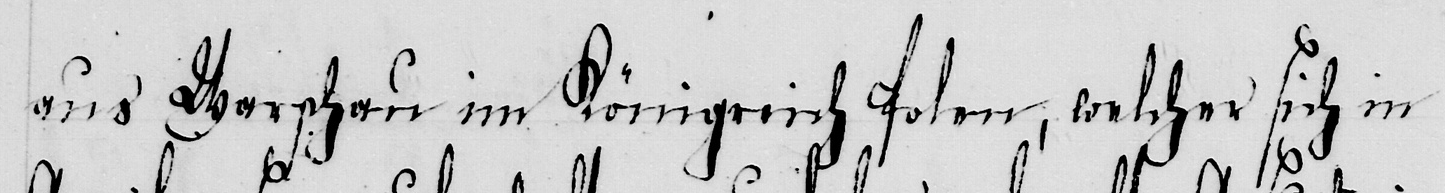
aus Warschau im Königreich Polen, welcher sich in
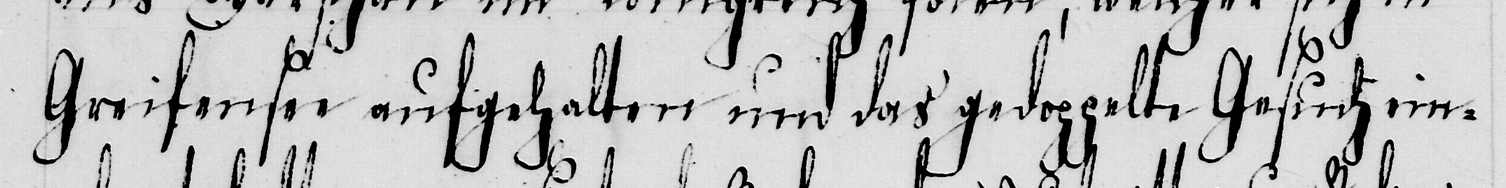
Greifensee aufgehalten und das gedoppelte Gesuch ein¬
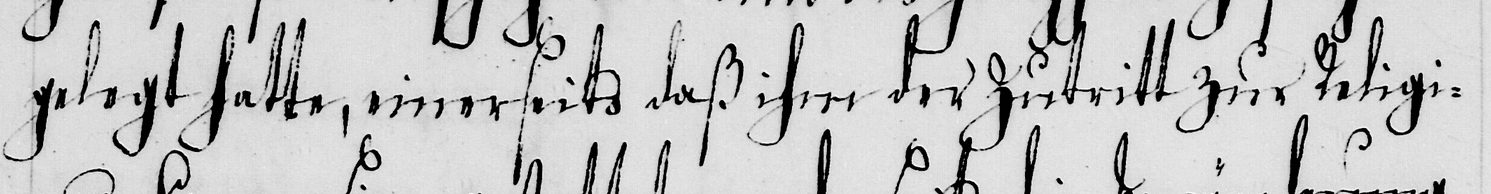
gelegt hatte, einerseits daß ihm der Zutritt zur Religi¬
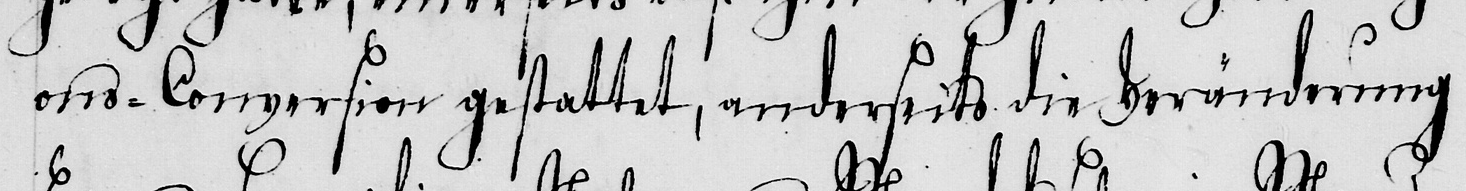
ons-Conversion gestattet, anderseits die Veränderung
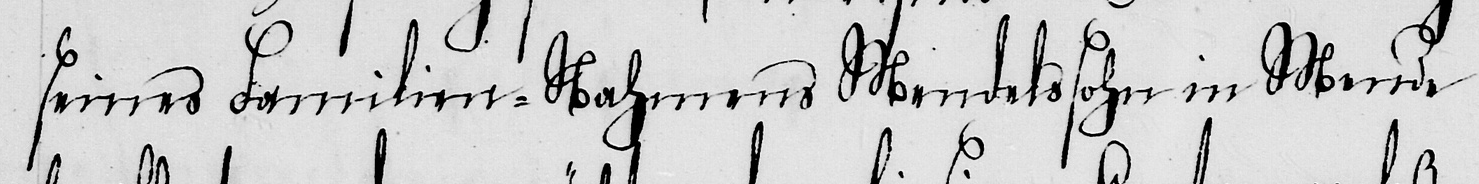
seines Familien-Nahmens Mendelssohn in Mende
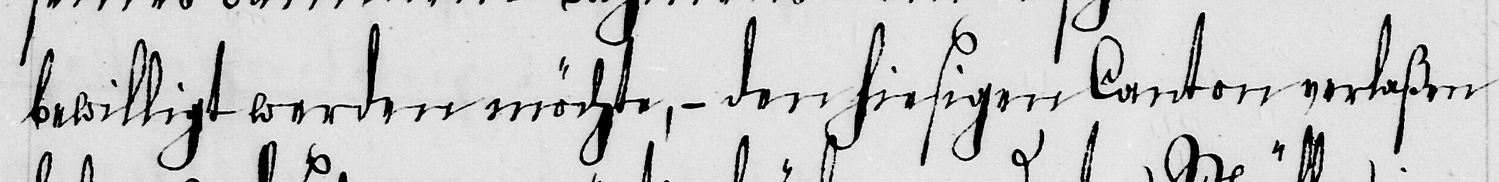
bewilligt werden möchte, – den hiesigen Canton verlaßen
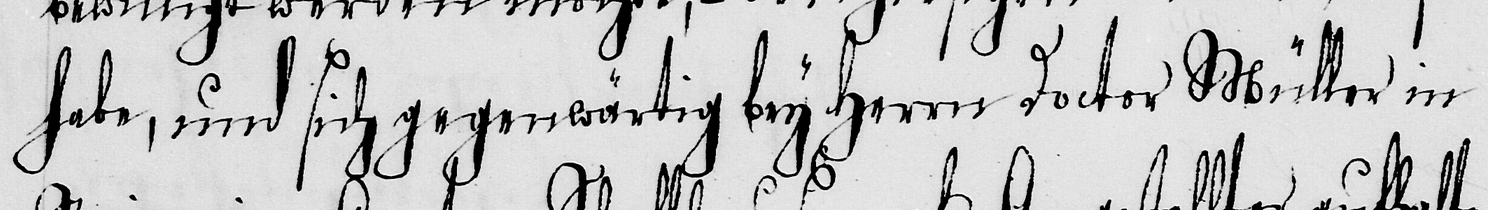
habe, und sich gegenwärtig bey Herrn Doctor Müller in
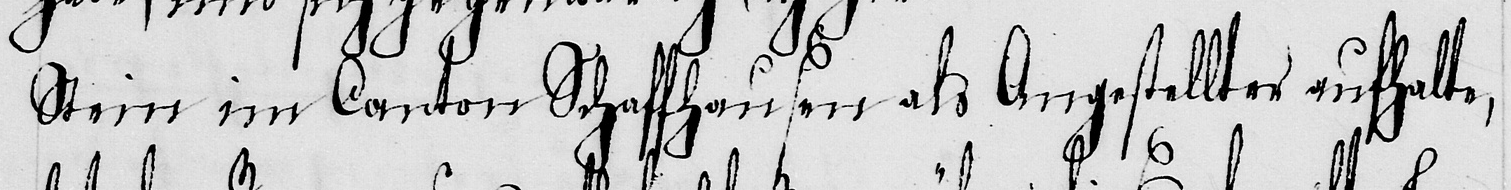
Stein im Canton Schaffhausen als Angestellter aufhalte,
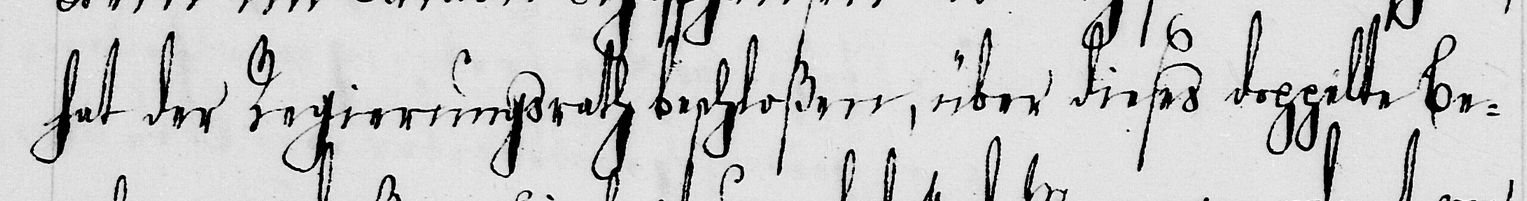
hat der Regierungsrath beschloßen, über dieses doppelte Be¬
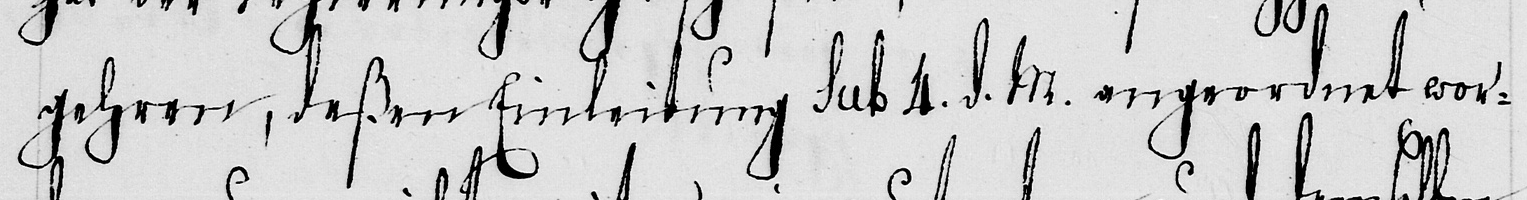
gehren, deßen Einleitung sub. 4. d. M. angeordnet wor¬
